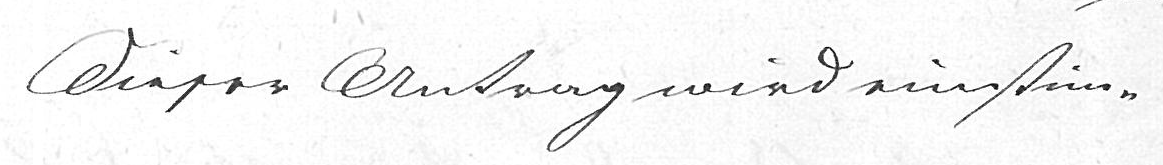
Dieser Antrag wird einstim-
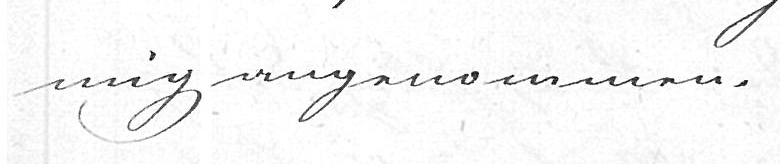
mig genommen.
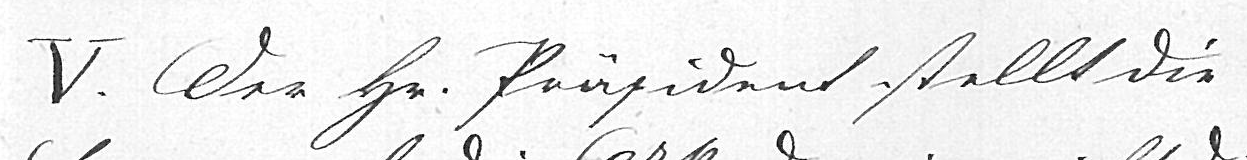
V. Der Hr. Präsident stellt die
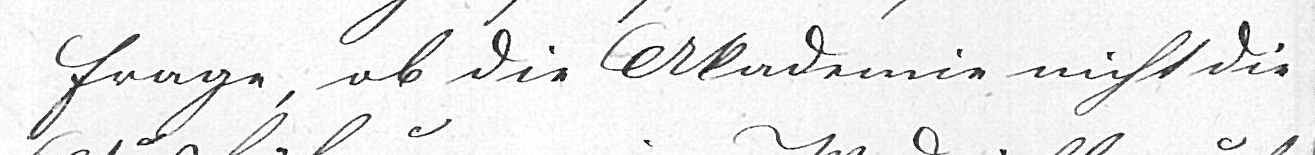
Frage, ob die Akademie nicht die
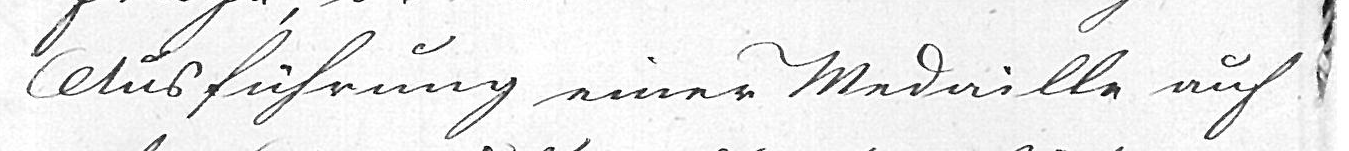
Ausführung einer Medaille auf
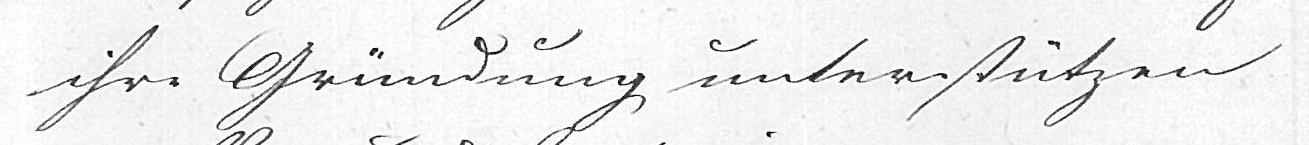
ihre Gründung unterstützen
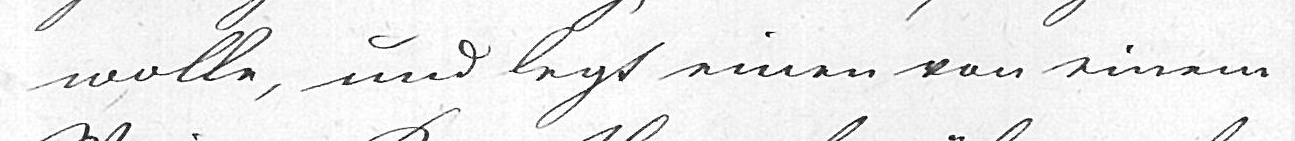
wolle, und legt einen von einem
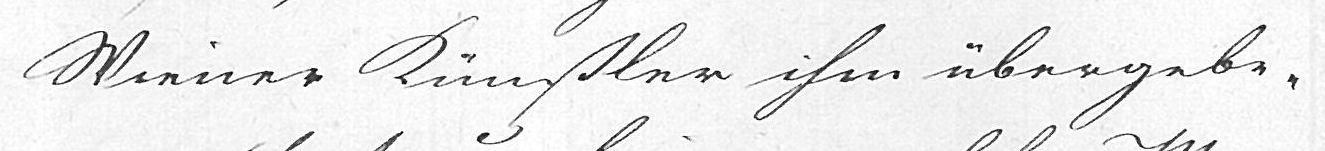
Wiener Künstler ihm übergebe-
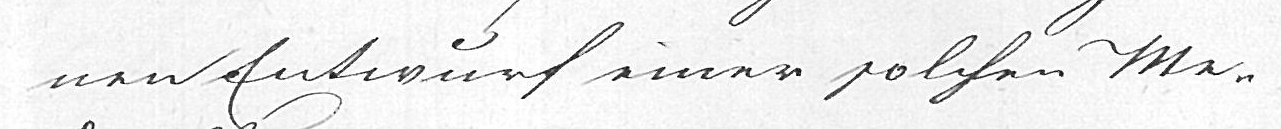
nen Entwurf einer solche Me-
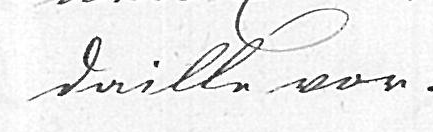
daille vor.
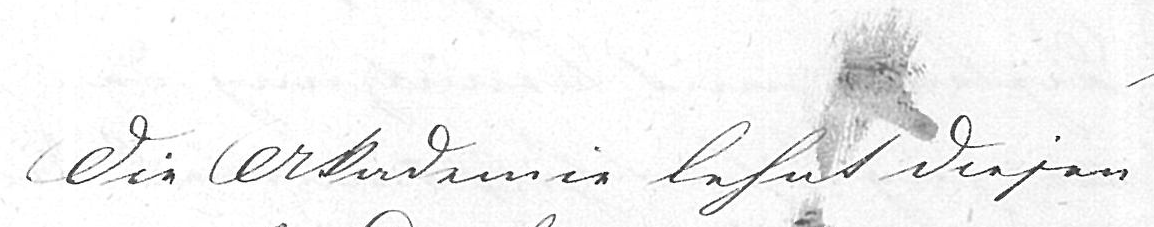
Die Akademie lehnt diesen
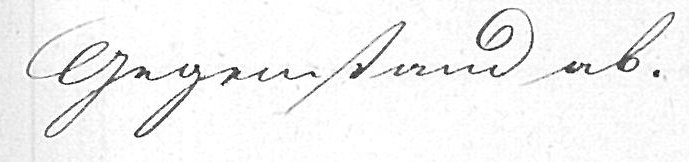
Gegenstand ab.
